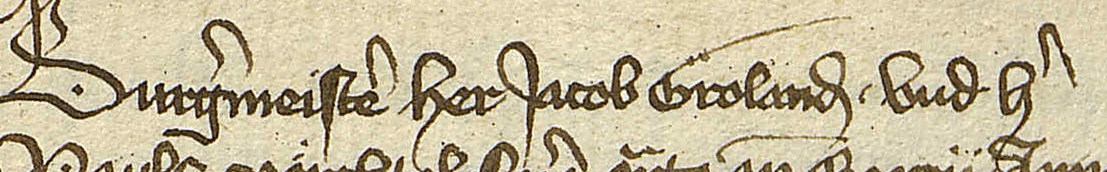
Burg*meiſte* her Iacob Groland* / vnd h*
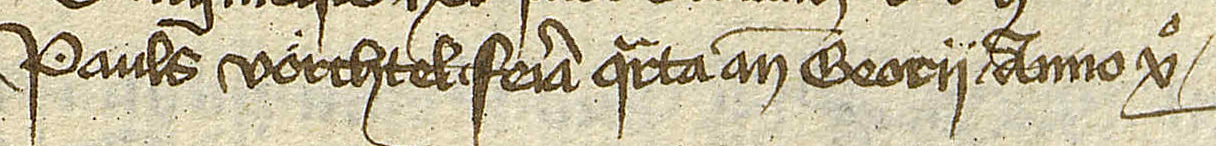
Pauls vörchtel / feia* qrta* an* Georii* / Anno x* /
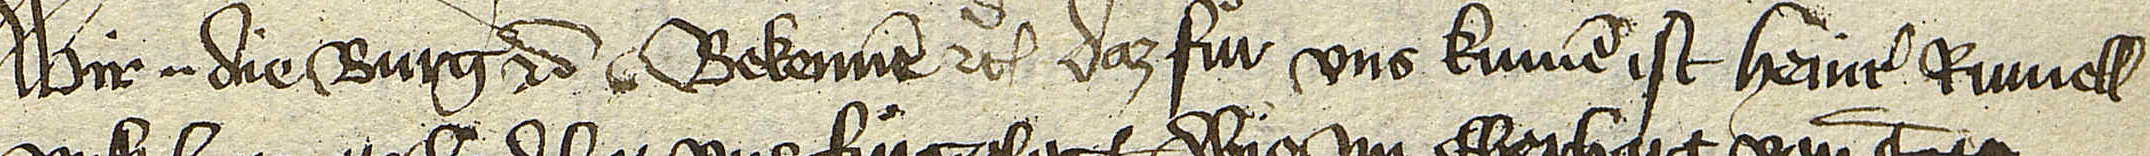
Wir ~ die Burg* ec* / Bekenne ec* daʒ für vns kume* iſt heinr* Rumell
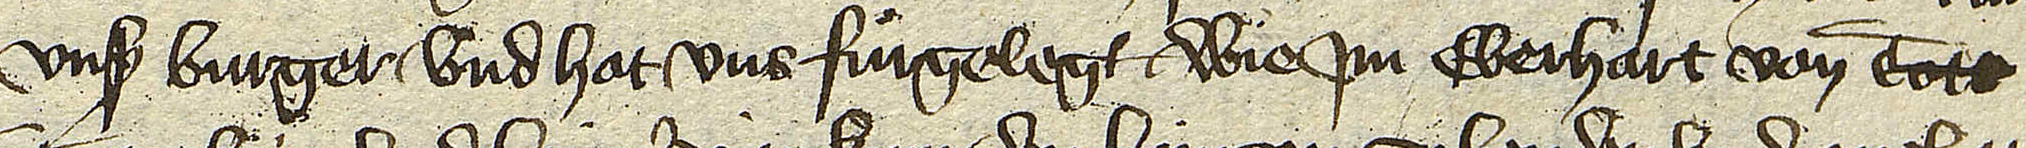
vnſ* burger / vnd hat vns fürgelegt / wie Im Eberhart von Tot%
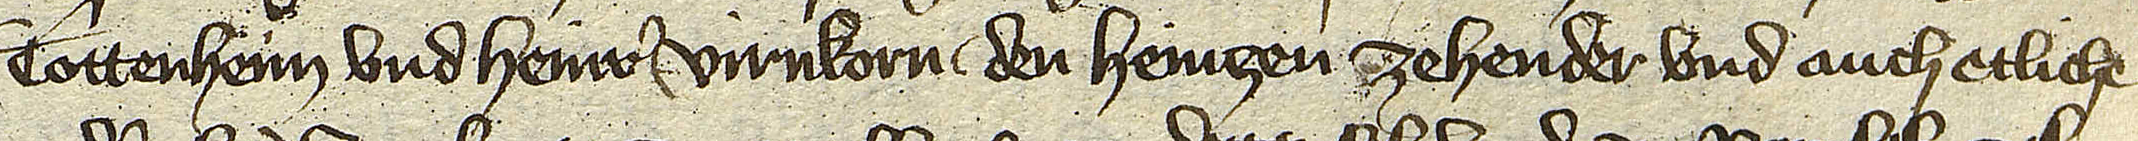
Tottenheim vnd heinr* virnkorn / den heincʒen ʒehender vnd auch etliche
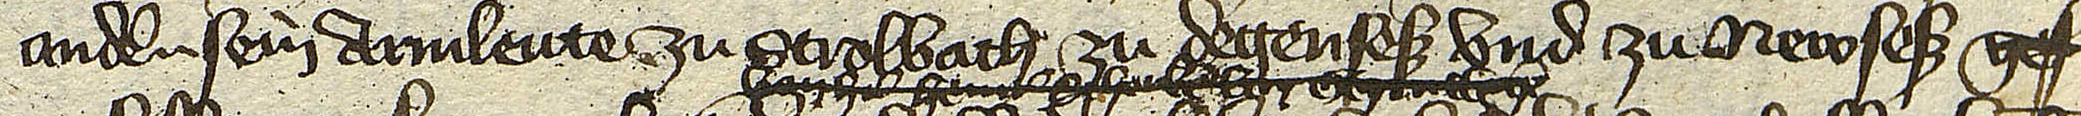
ande* ~ ſein Armleute cʒu Strolbach cʒu degenſeſʒ vnd cʒu Newſeſʒ geſ
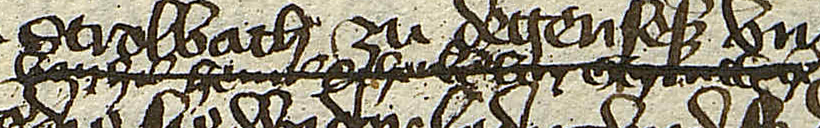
von hr* heinr* Schenke* von %%%% weg*
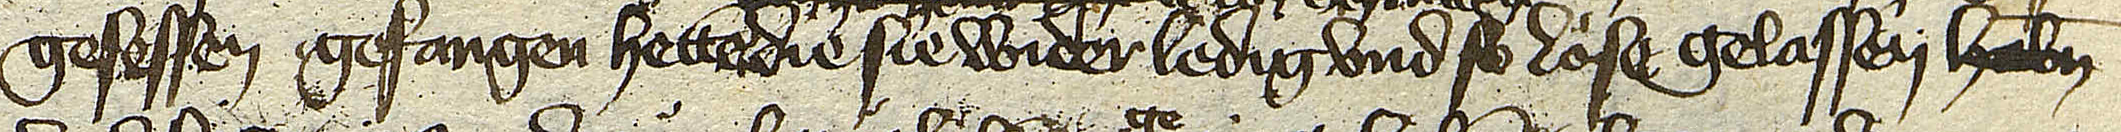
geſeſſen gefangen hette* die ſie wider ledig vnd ſo löſe gelaſſen habn*
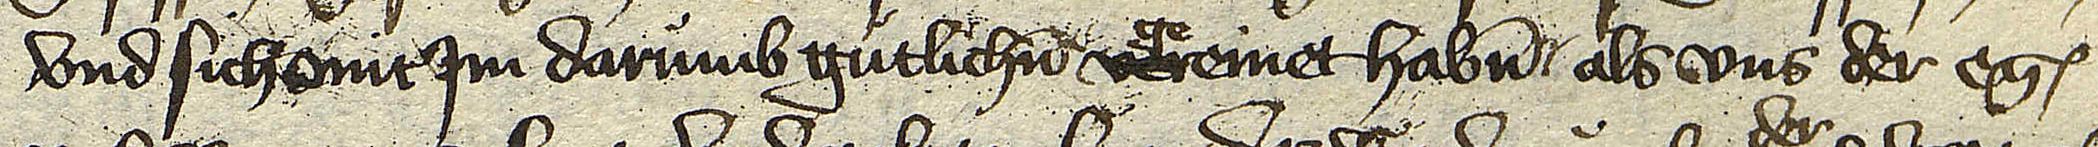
vnd ſich mit Im darümb gütlichn* vereinet habn* / als vns der eg*
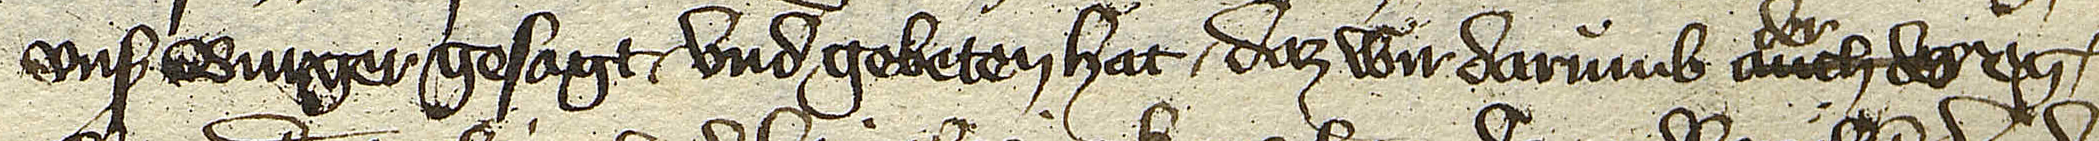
vnſ* Burger geſagt / vnd gebeten hat / daʒ wir darümb auch der eg*
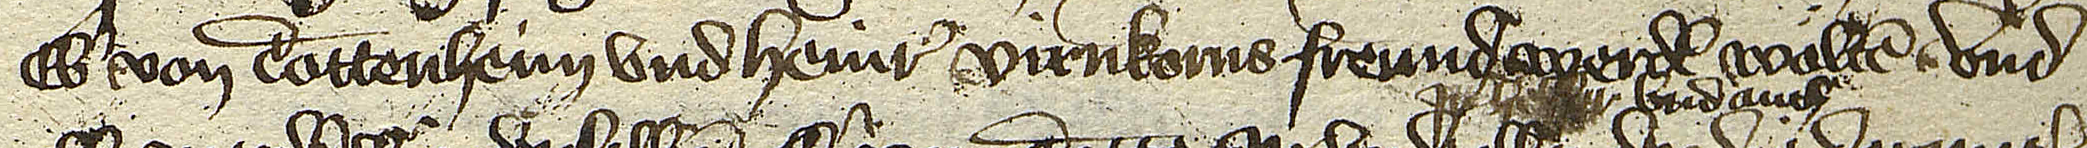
Eb* von Tottenheim vnd heinr* virnkorns freund werd* wölle / vnd
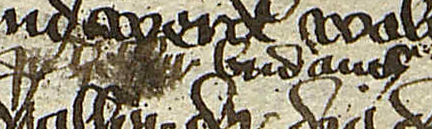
Ir helffer vnd auch
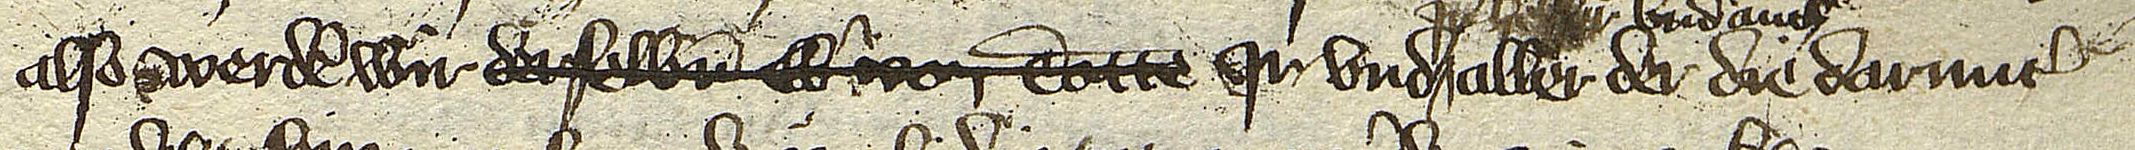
alſo werde* wir derſelbn* Eb* von Totte Ir vnd aller der die darunt*
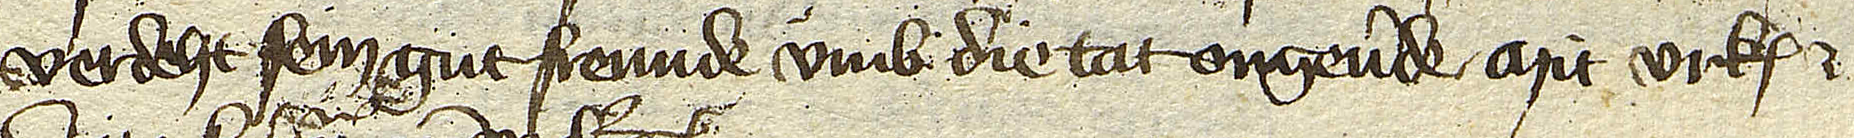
verdeht ſein / gut freunde v̈mb die tat ongeu*de / Mit vrk* %
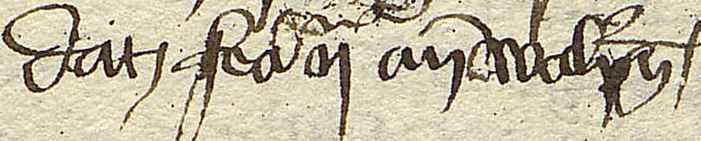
dat* fea* ii* an* walp*g*
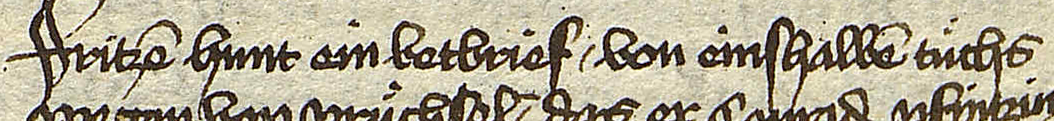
Fritʒe* hunt ein betbrief / von einſhalbe* tüchs
